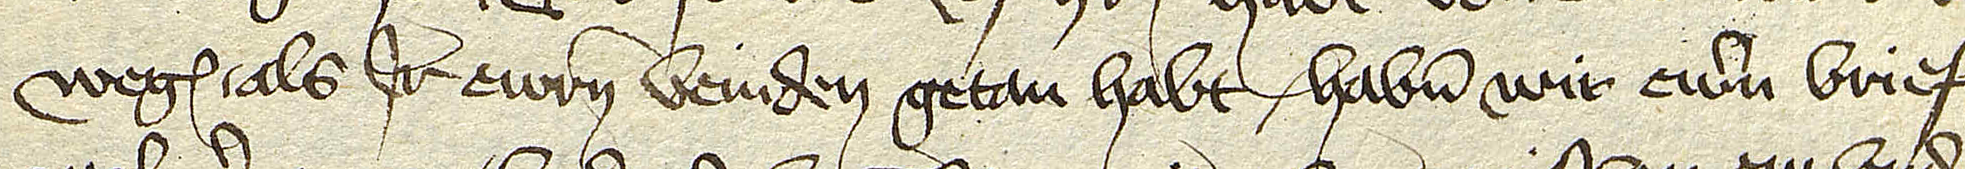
weg* / als Ir ewrn* veinden getan habt / habn* wir ewn* brief
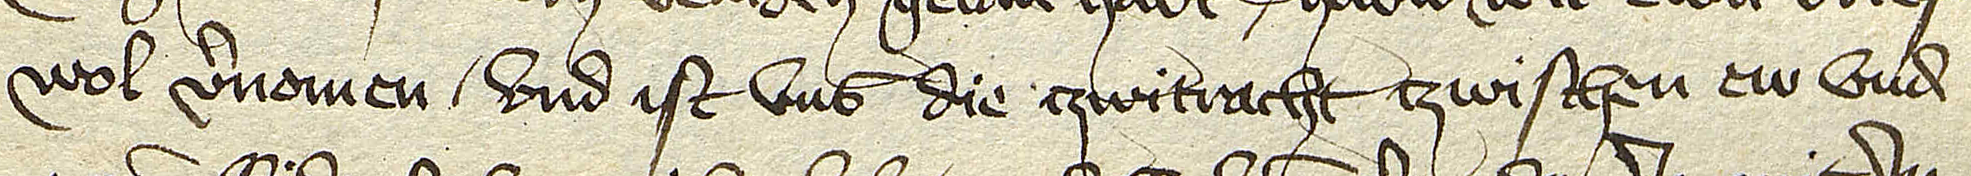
wol v*nomen / vnd iſt vns die cʒwitracht cʒwiſchen ew vnd
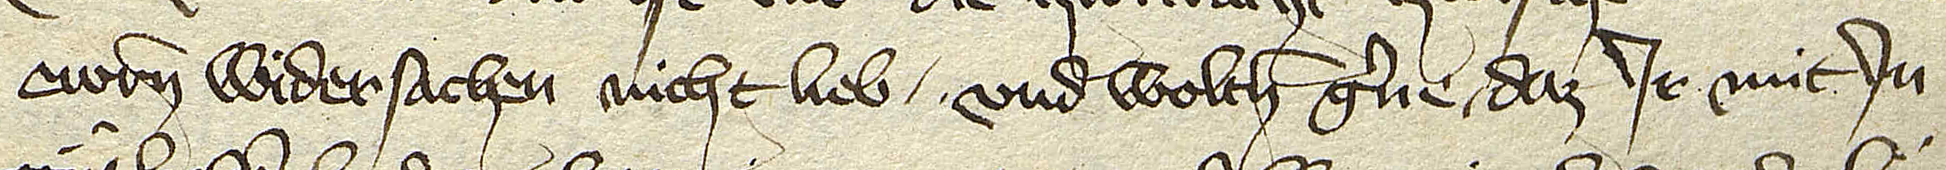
ewrn* widerſachen nicht lieb / vnd woltn* g*ne / daʒ Ir mit In
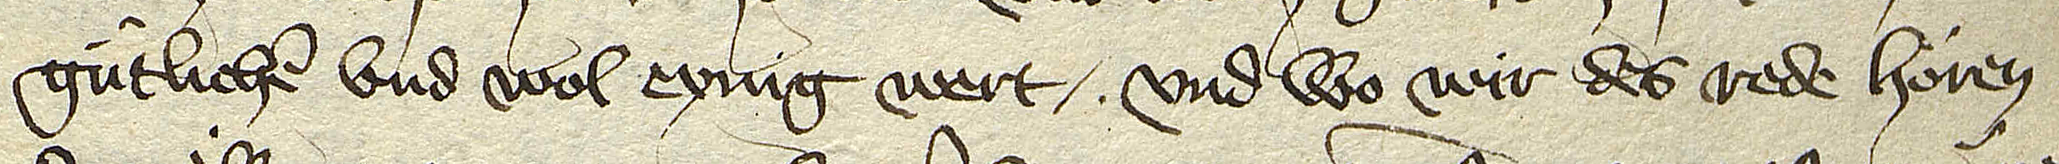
gütliche* vnd wol eynig wert / . vnd wo wir des rede hören
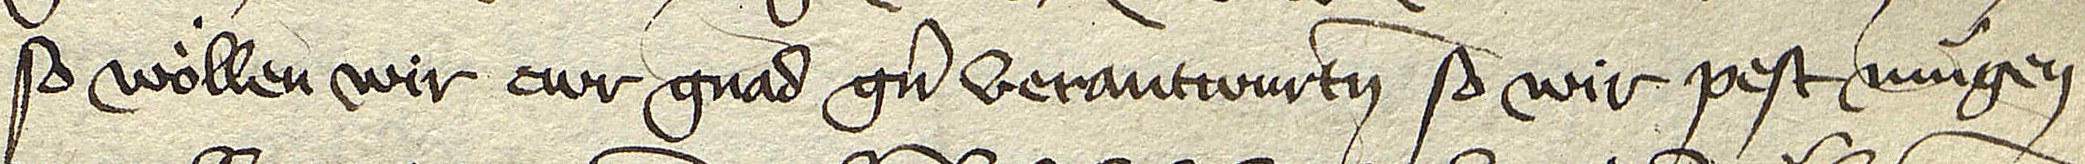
ſo wöllen wir ewr gnad gn* verantwurtn* ſo wir peſt mügen
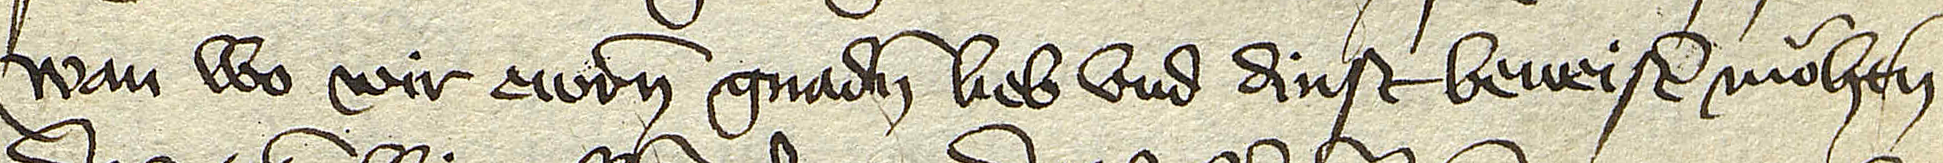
wan wo wir ewrn* gnadn* lieb vnd dinſt beweiſe* möhtn*
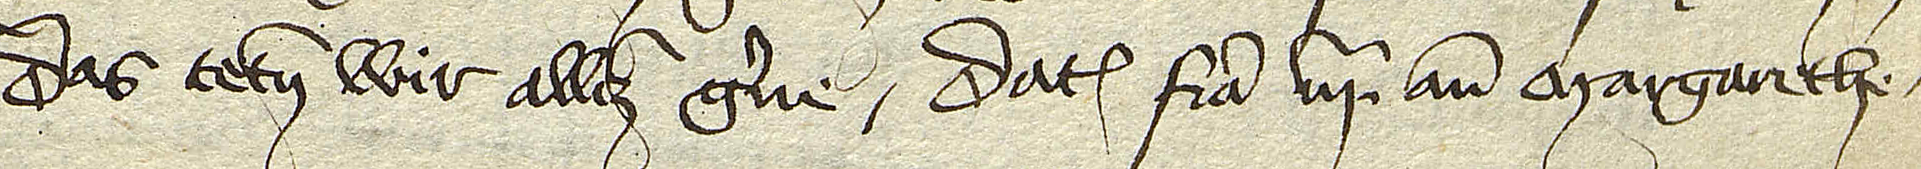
Das tetn* wir allcʒ* g*ne / Dat* fia* iii* . an* Margarethe /
